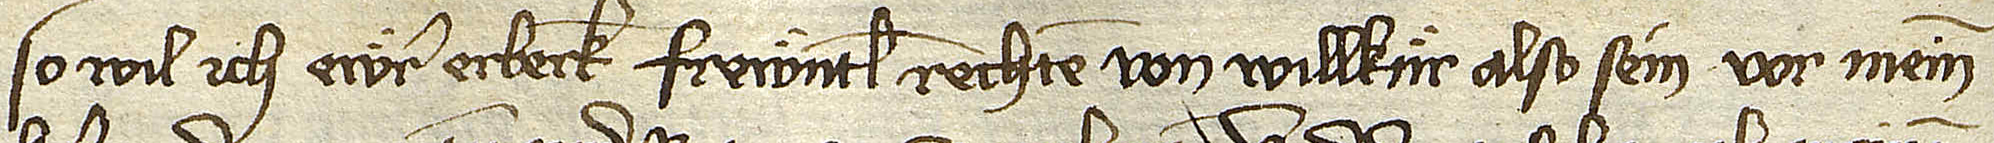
ſo wil ich ew*r erberk* frewntl* rechte* von willkür alſo ſein vor mein*
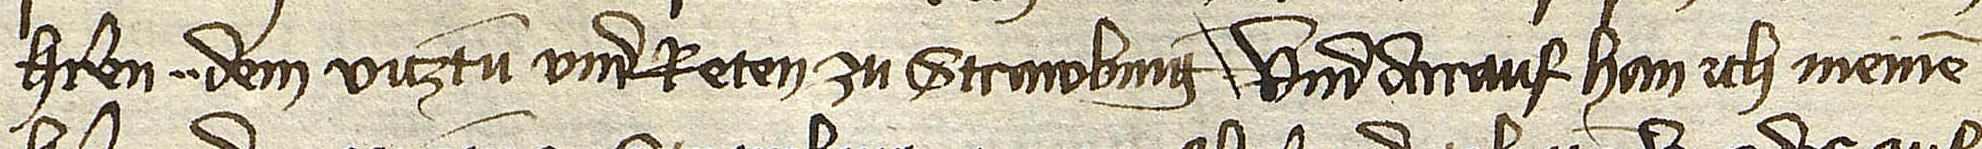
h*ren ~ dem vicʒtu* vnd Reten ʒu Strawbing Vnd darauf han ich meine*
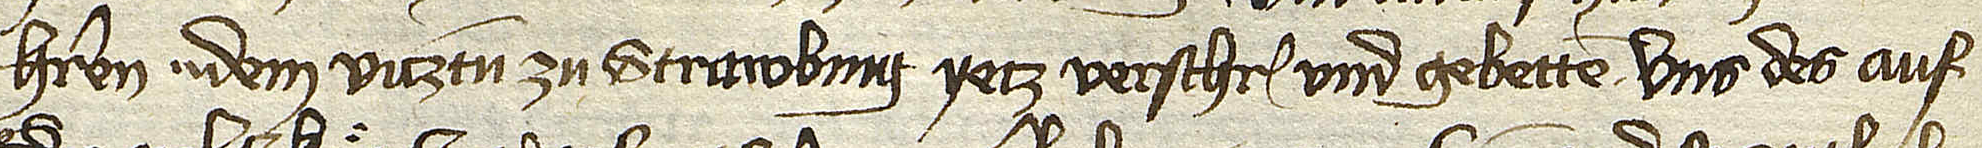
h*ren ~ dem vicʒtu* ʒu Strawbing yecʒ verſchr* vnd gebette* . Vns des auf
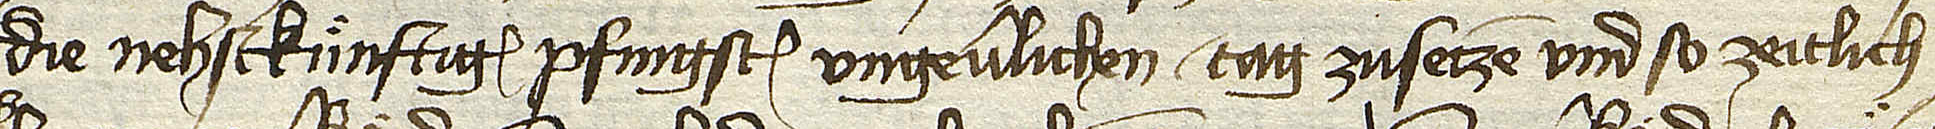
die nehſtkünftig* pfingſt* vngeu*lichen / tag ʒuſecʒe* vnd ſo ʒeitlich
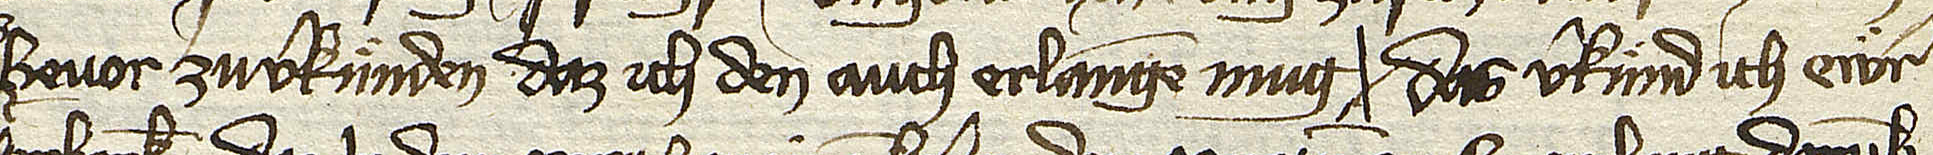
beuor ʒu v*künden . daʒ ich den auch erlange* mug Das v*künd ich ew*r
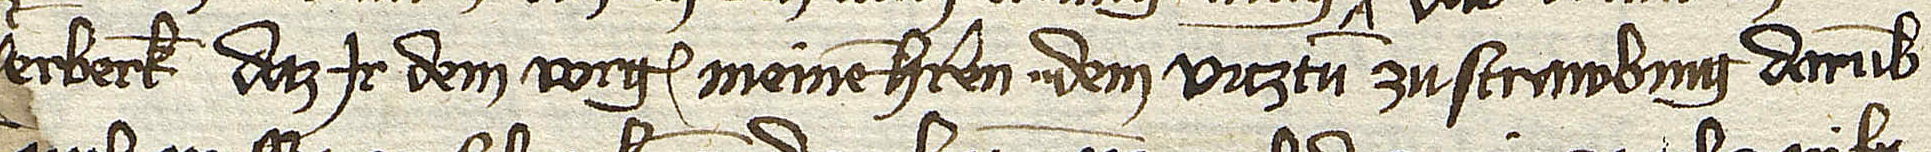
erberk* daʒ Ir dem vorg* meine* h*ren ~ dem vicʒtu* ʒu Strawbing daru*b
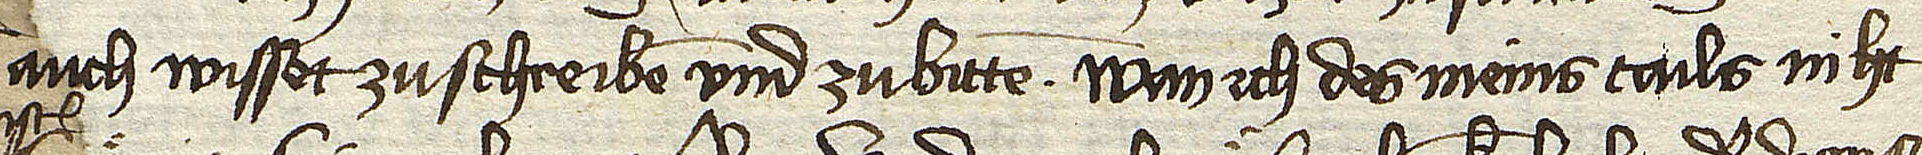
auch wiſſet ʒu ſchreibe* vnd ʒu bitte* . wan ich des meins tails niht
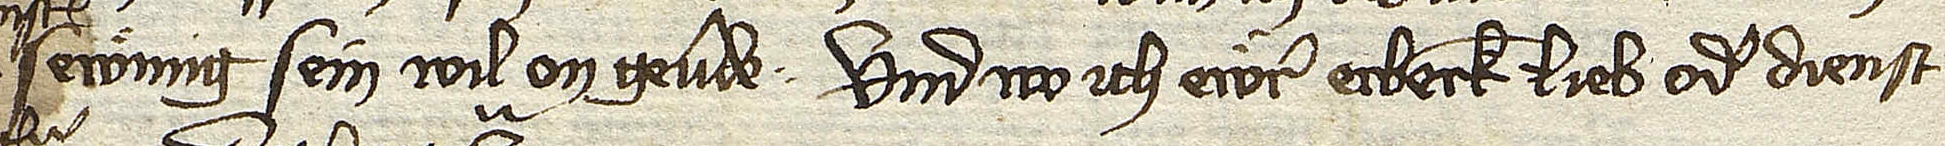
ſewmig ſein wil on geu*de : Vnd wo ich ew*r erberk* lieb od* dienſt
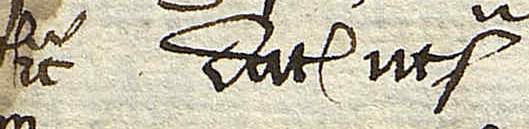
ec* Dat* ut ſ*
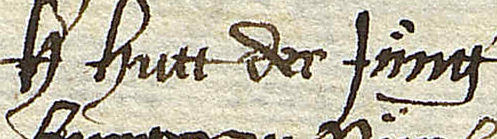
H* hutt der Iüng*
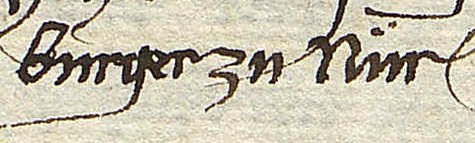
burger ʒu Nür*
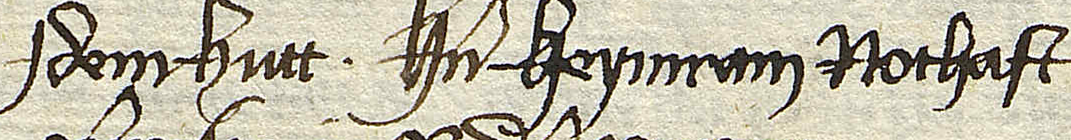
Idem hutt . H*n heymram Nothaſt
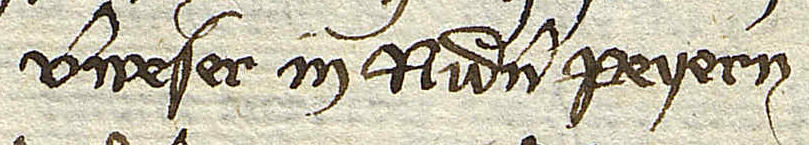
v*weſer in Nid*n Peyern
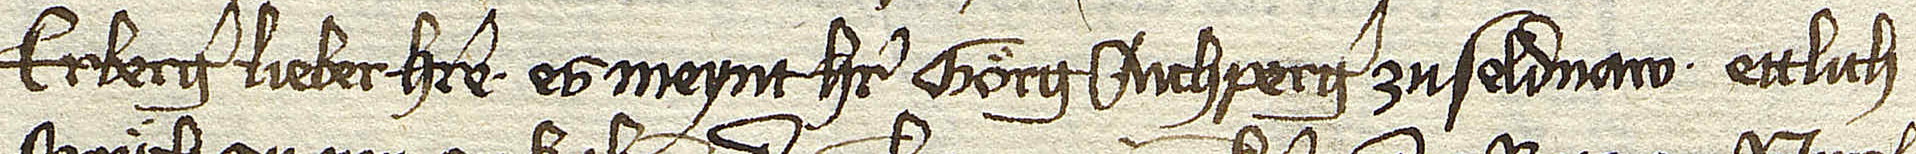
Erberg* lieber h*re . es meynt h*r Görg Aichperg* ʒu ſeldnaw . ettlich
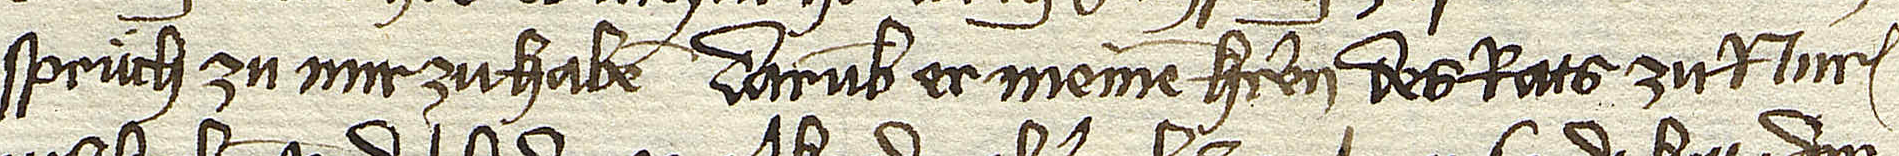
ſprüch ʒu mir ʒu habe* Daru*b er meine* h*ren des Rats ʒu Nur*
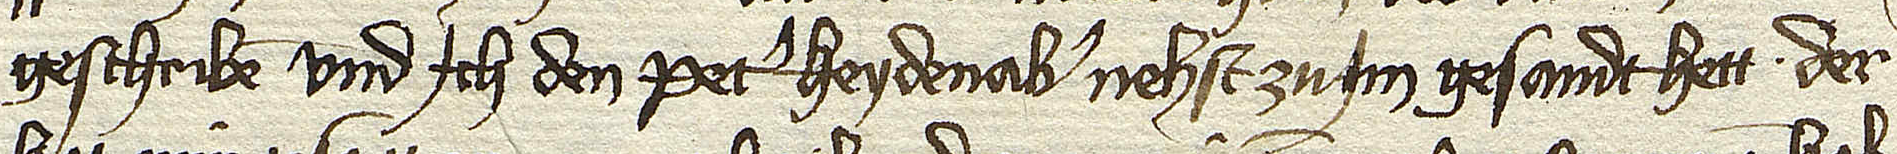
geſchribe* vnd Ich den Pet* heydenab* nehſt ʒu Im geſandt hett . der
